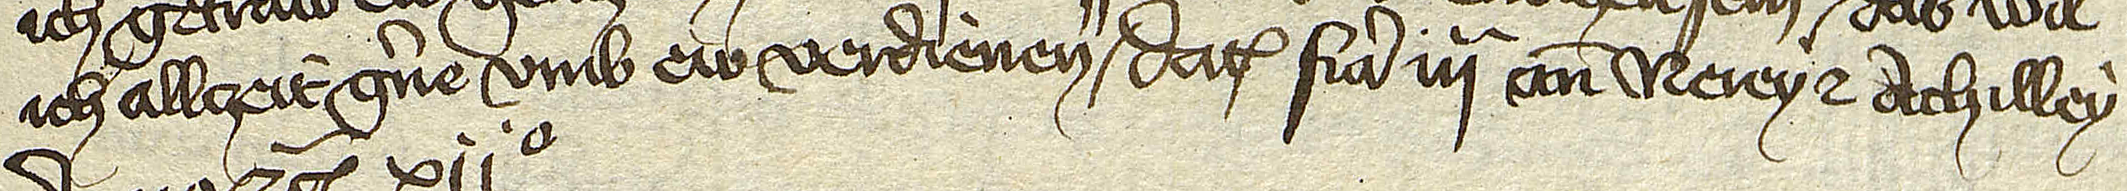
ich allcʒeit g*ne vmb ew verdienen / Dat* fia* iii* an* Nerey @ Achilley
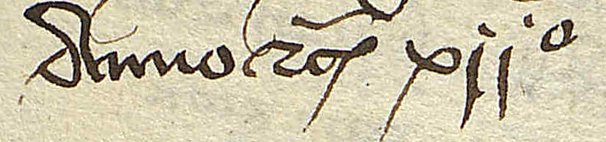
Anno ec* xii*
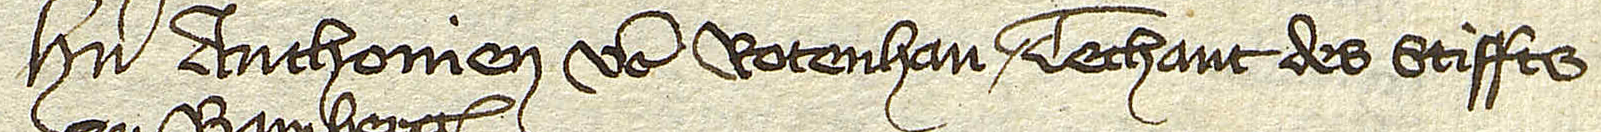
hn* Anthonien vo* Rotenhan / Techant des Stiffts
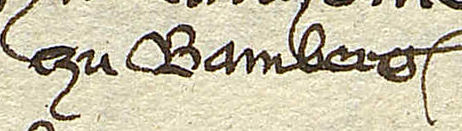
cʒu Bamberg*
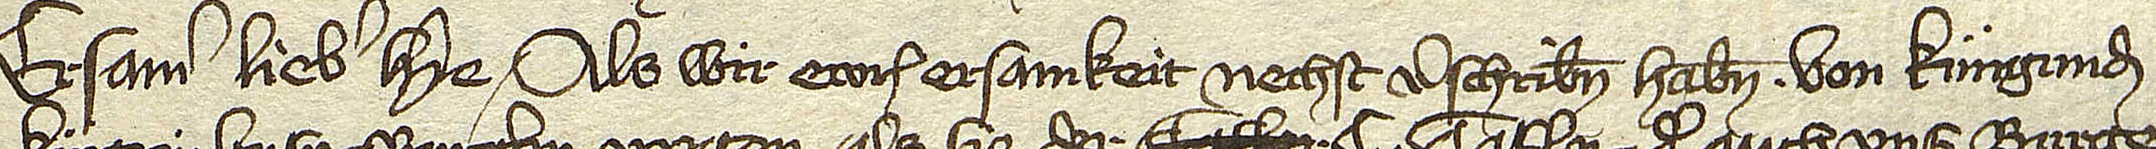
Erſam* lieb* h*re / Als wir ewr*erſamkeit nechſt v*ſchribn* habn* . von küngund*
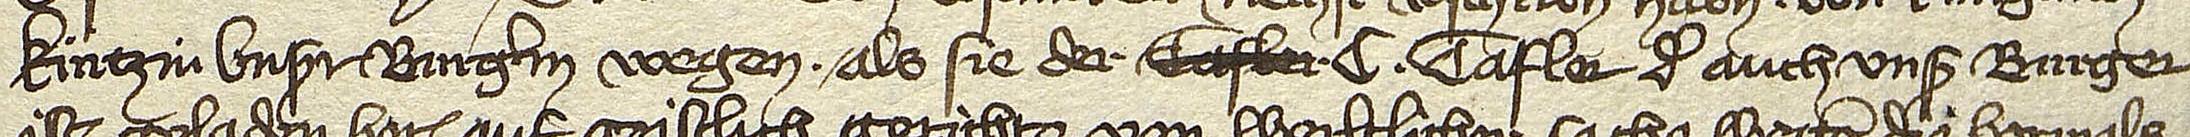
kürcʒin vnſ*r Burg*in wegen . / als ſie der Tafler C . Tafler d* auch vnſ* Burger
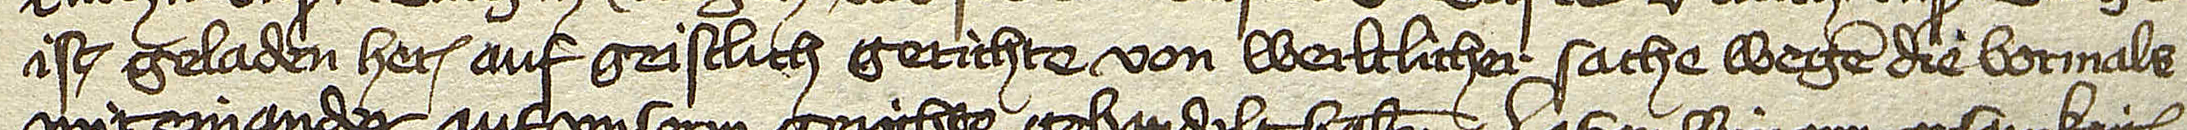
iſt / geladen het / auf geiſtlich gerichte von werltlicher ſache wege* die vormals
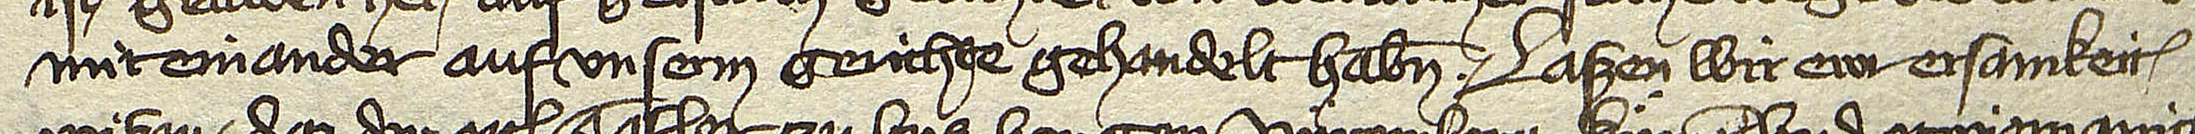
mit einander auf vnſerm gerichte gehandelt habn* . / Laſʒen wir ewr erſamkeit*
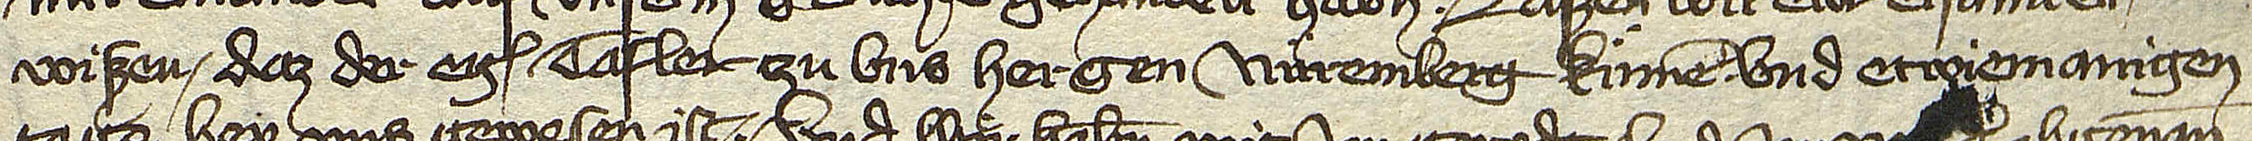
wiſʒen / daʒ der eg* Tafler cʒu vns her gen Nüremberg küme* . vnd erwiemanigen
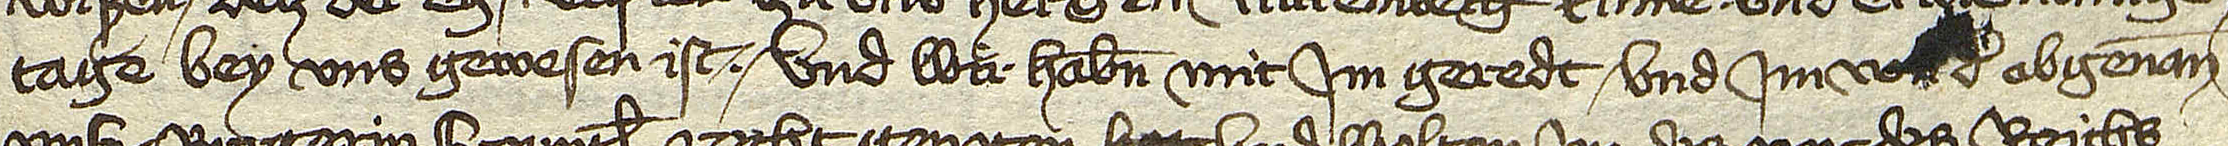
tage bey vnd geweſen iſt . / vnd wir habn* mit Im geredt / vnd Im von d* obgenan*
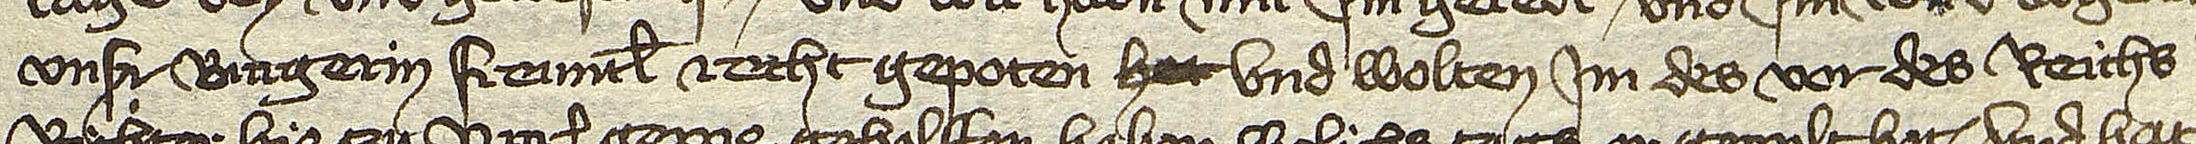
vnſ*r Burgerin freuntl* recht gepoten het vnd wolten Im des vor des Reichs
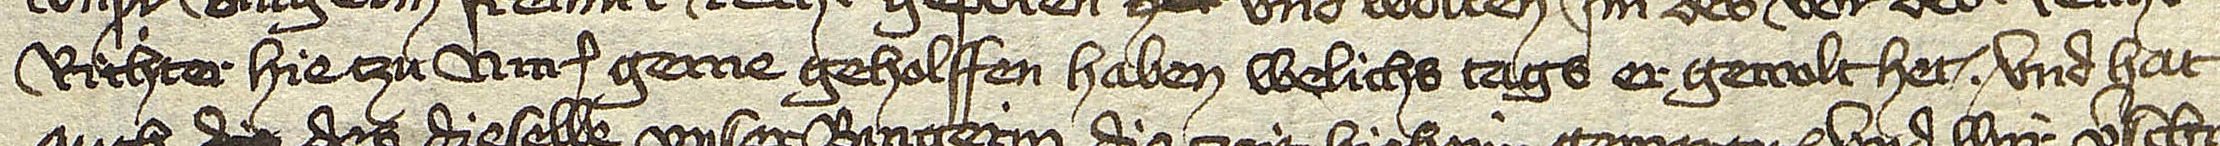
Richter hie cʒu Nur* gerne geholffen haben welichs tags er gewolt het* . / vnd hat
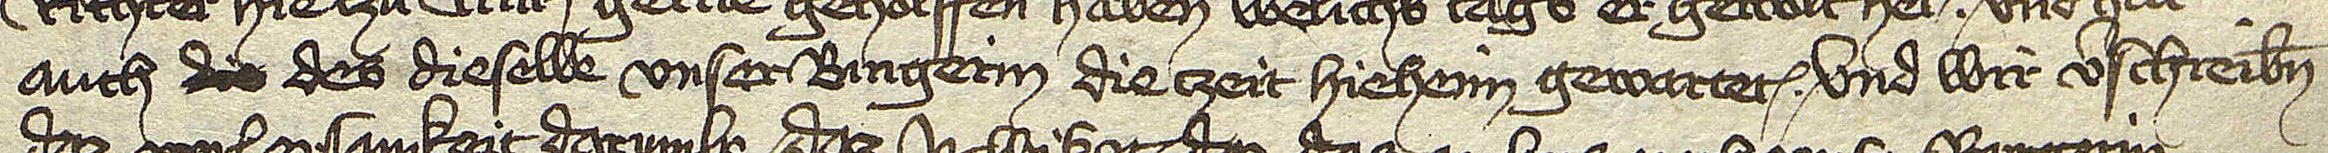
auch die des dieſelbe vnſer Burgerin die cʒeit hieheim gewartet* . / vnd wir v*ſchreibn*
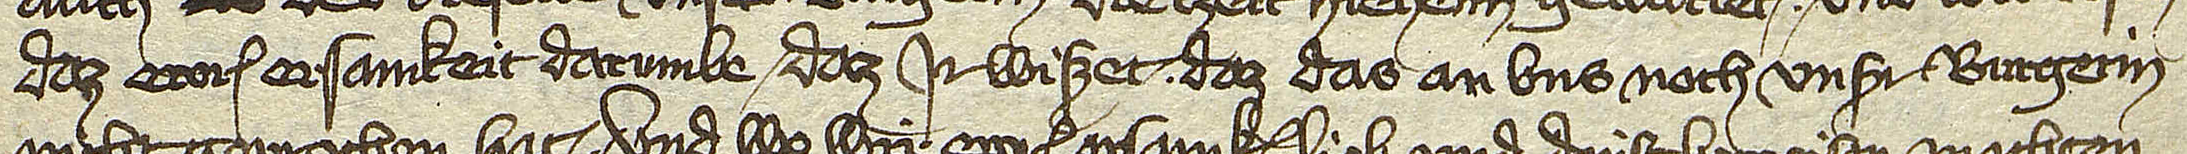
daʒ ewr* erſamkeit darumbe / daʒ Ir wiſʒet / . daʒ das an vns noch vnſ*r Burgerin
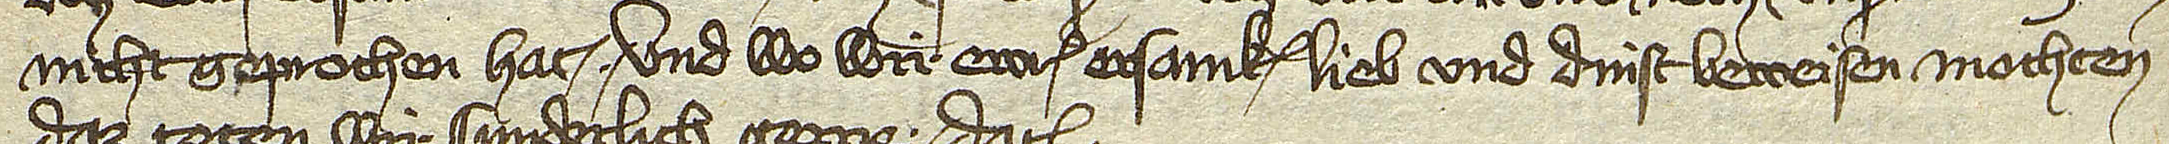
nicht geprochen hat . / vnd wo wir ewr* erſamk* lieb vnd dinſt beweiſen mochten
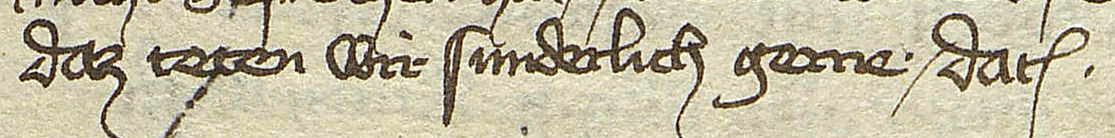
daʒ teten wir ſunderlich gerne / dat* .
